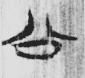公
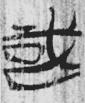或（又）
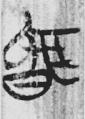䎽（聞）
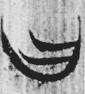曰
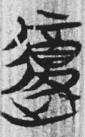○（復）
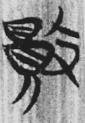敗
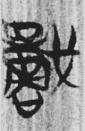○（戰）
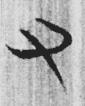又（有）
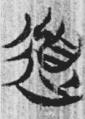道
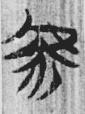{虍介}
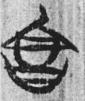合
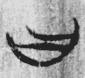曰
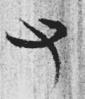又
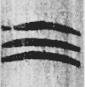三
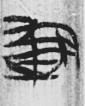軍
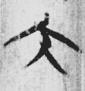大
